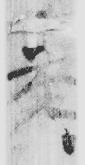天
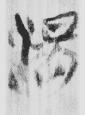湯
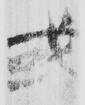或
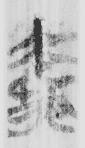{尒䎽}
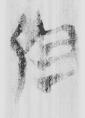於
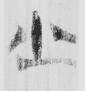少
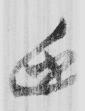臣
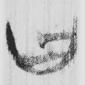曰
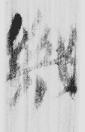幾
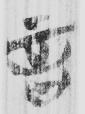言
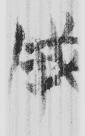成
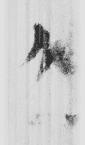人
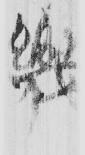幾
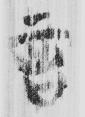言
